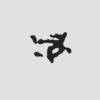𠭁
